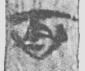百
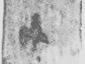十
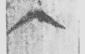六
